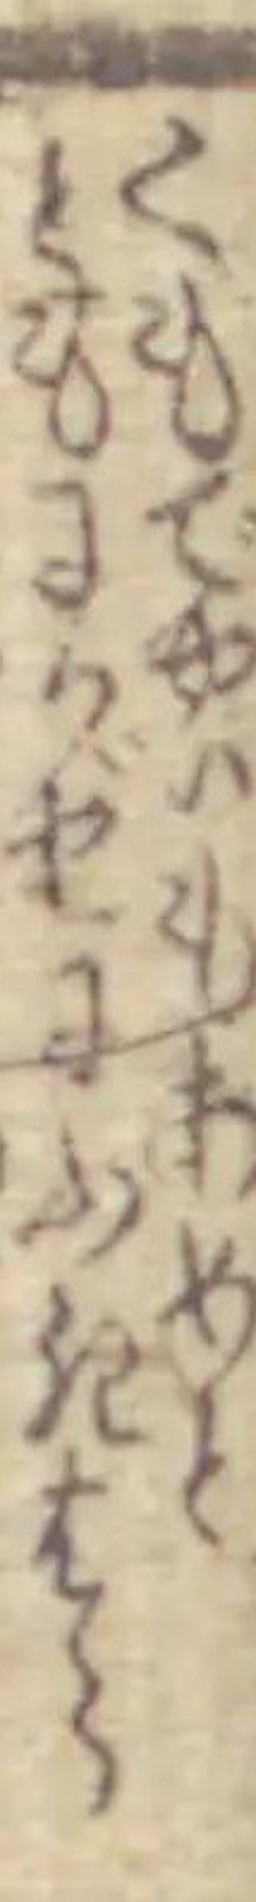ともにかぜにふきはら
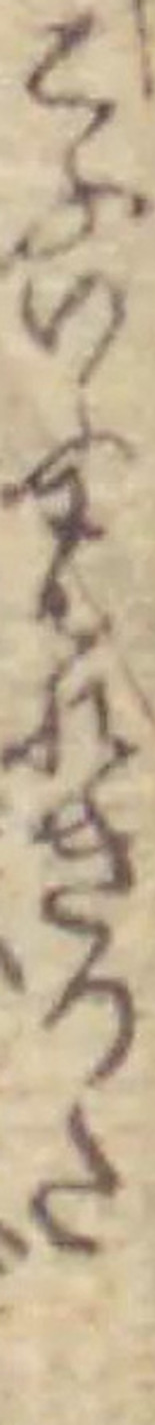〽こふいふはれきつた
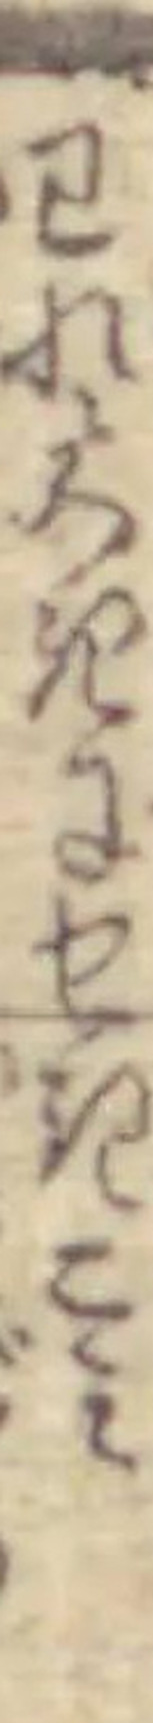われ大きにせきこみ
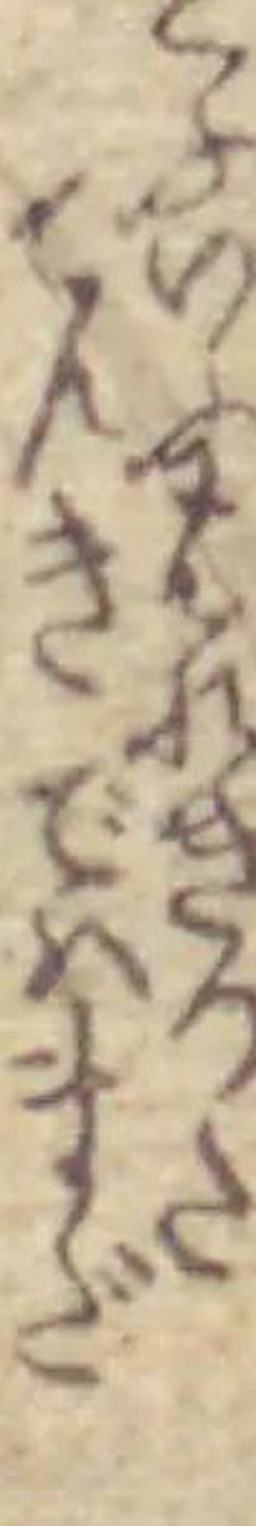てんきではまだ
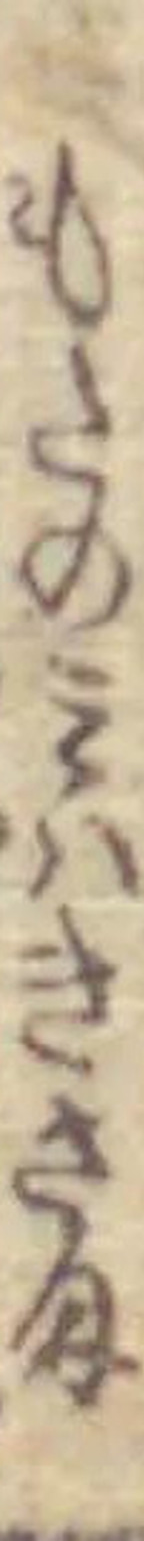もたのみはきさま
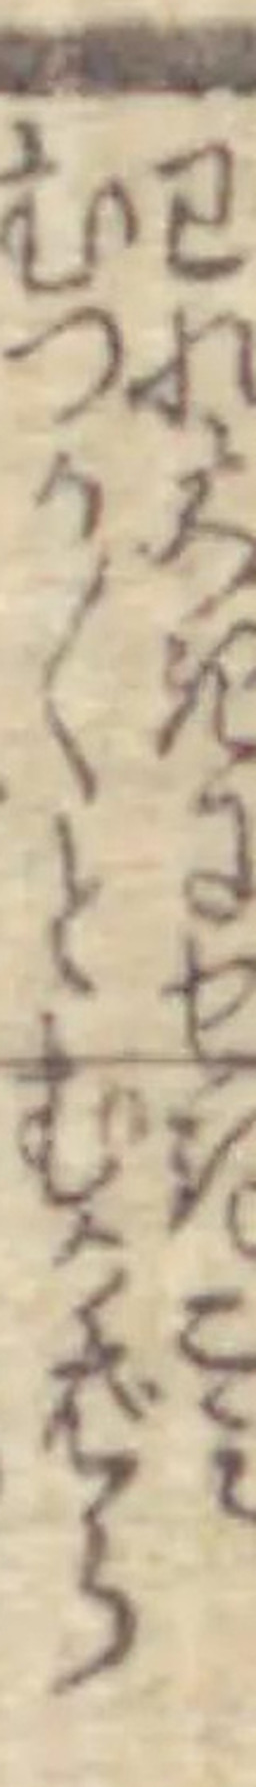むつか〳〵とむかばら
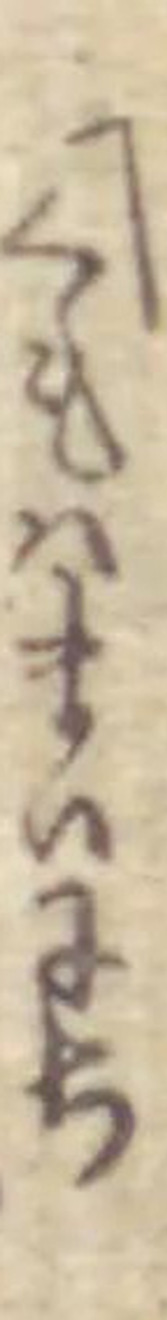〽くもはまいにち
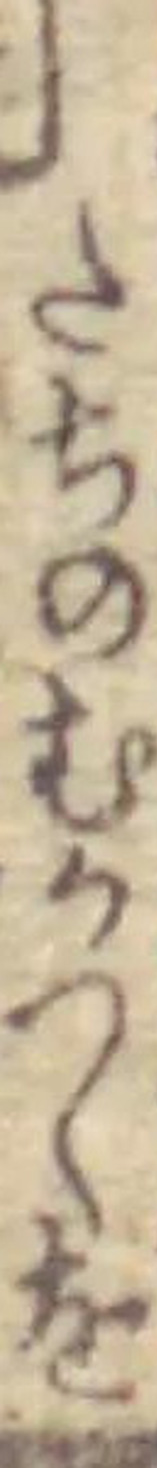たちのむかつくを
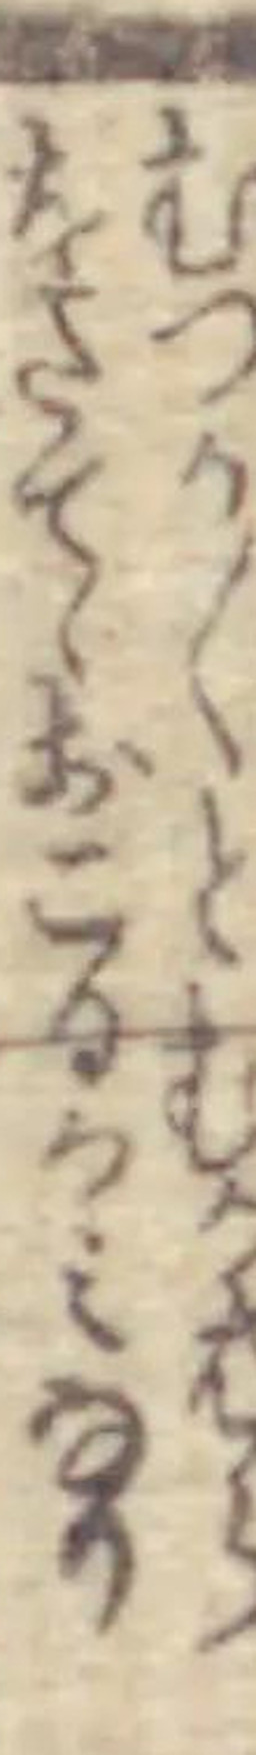をたてゝおこるかみなり
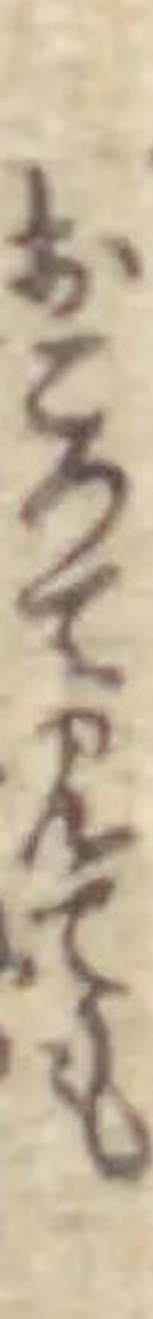おこつてみても
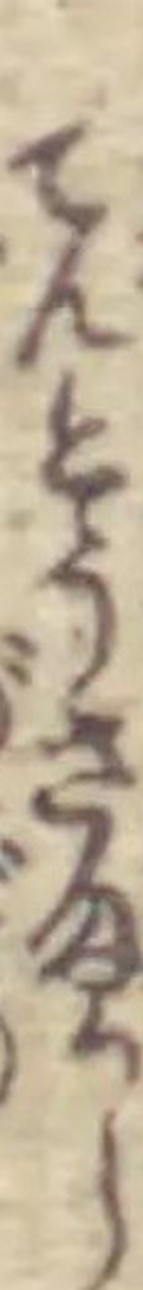てんとうさまから
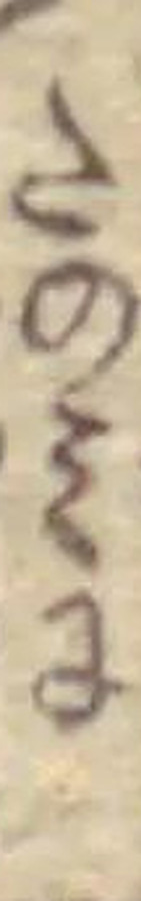たのみに
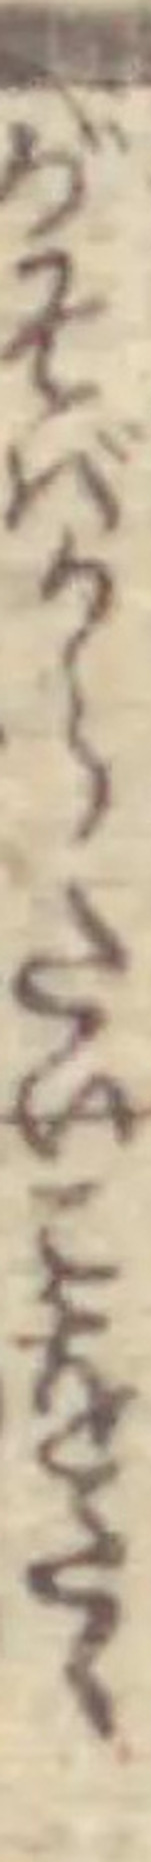がそばからたいこをたゝ
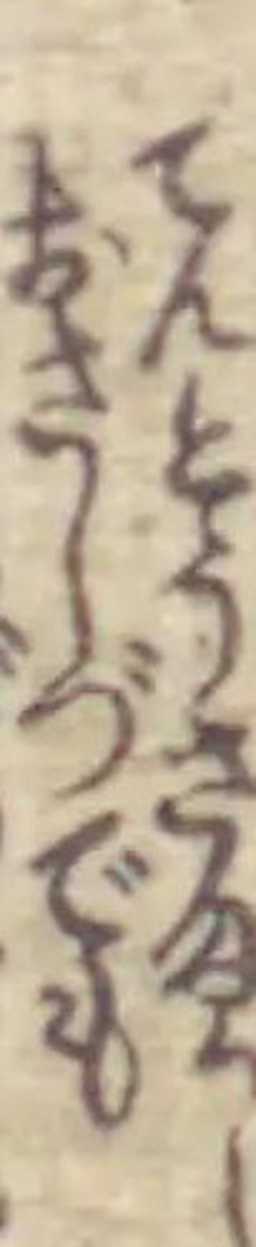おさしづでも
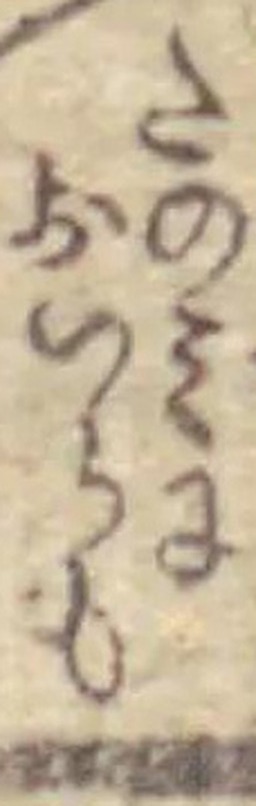おいらも
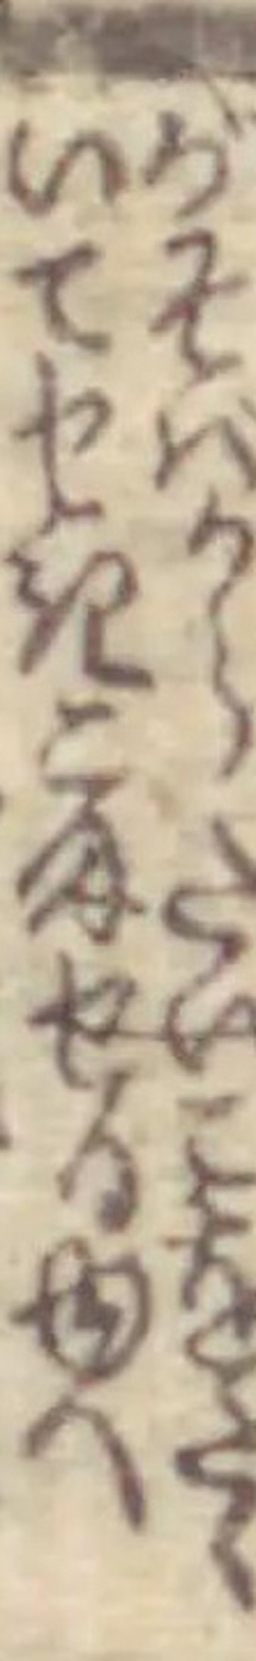いてせきこませるゆへ
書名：雨宮風宮出儘略縁記 3巻
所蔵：国立国会図書館 National Diet Library, JAPAN
